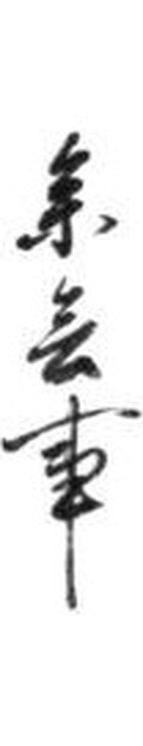参会事
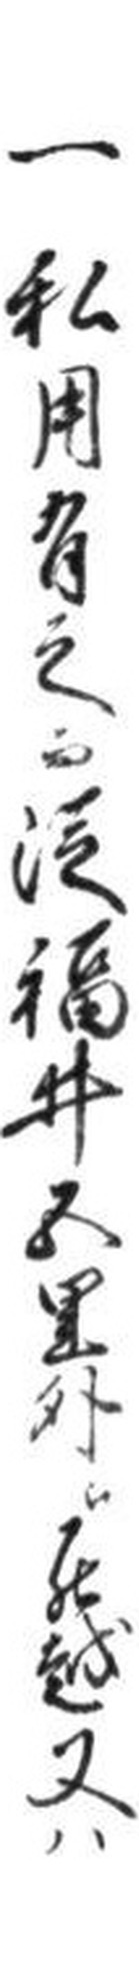一私用有之而従福井五里外え罷越又は
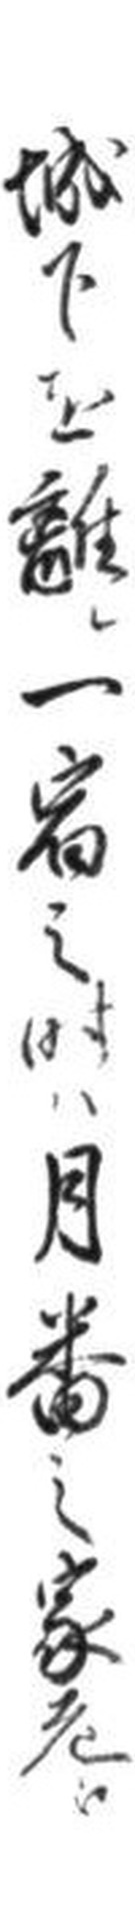城下を離れ一宿之時は月番之家老え
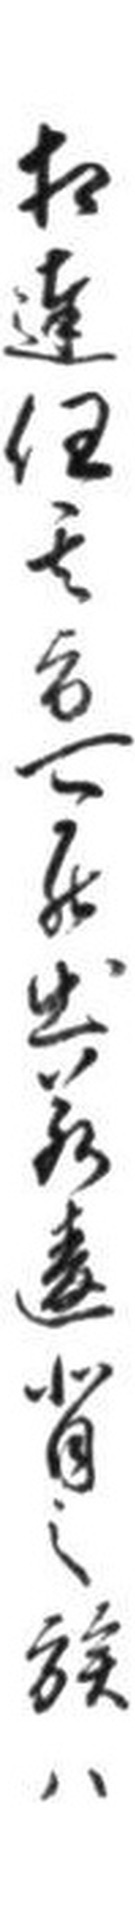相達任其旨可罷出若違背之族は
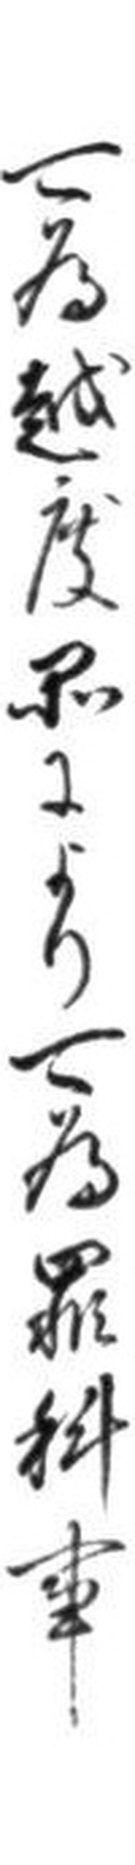可為越度品により可為罪科事
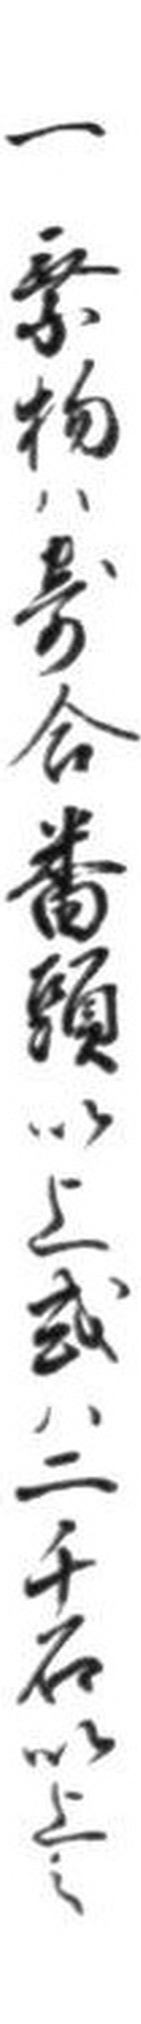一乗物は寄合番頭以上或は二千石以上之
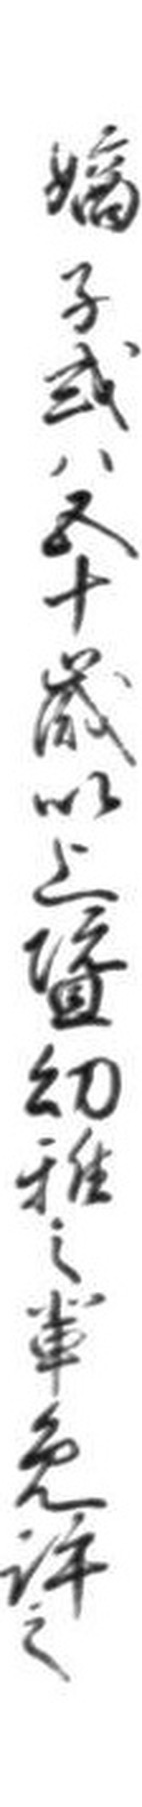嫡子或は五十歳以上曁幼稚之輩免許之
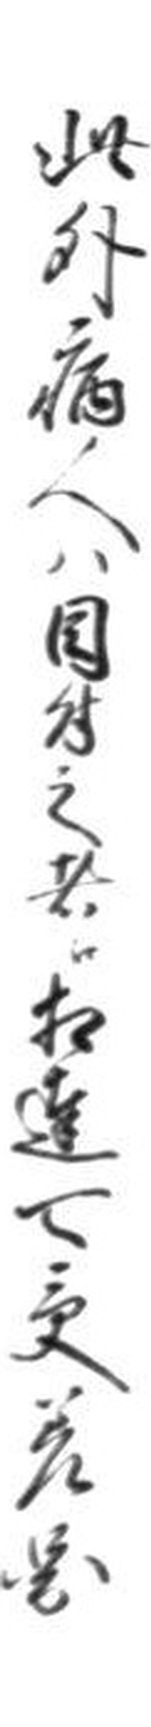此外病人は目付之者え相達可受差図
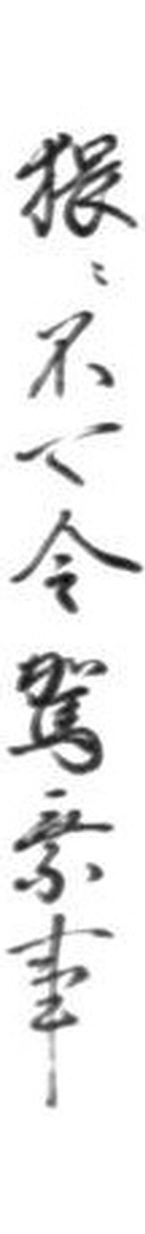猥に不可令駕乗事
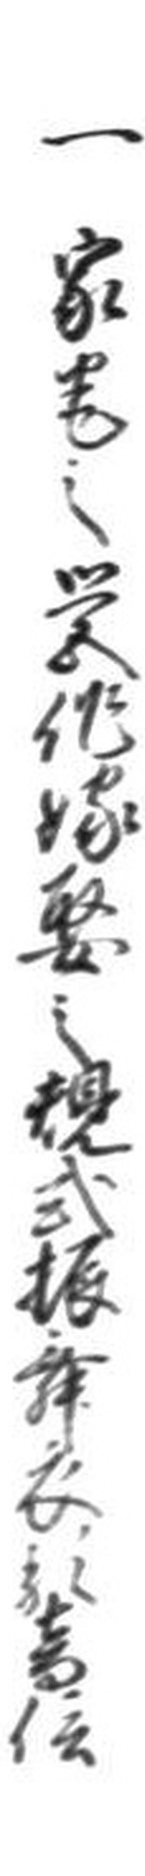一家宅之営作嫁娶之規式振舞衣類音信
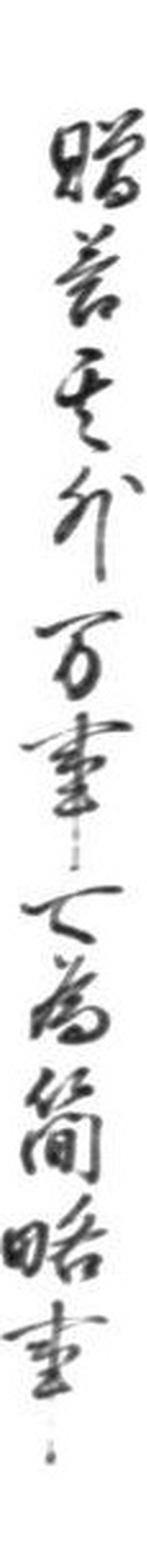贈答其外万事可為簡略事
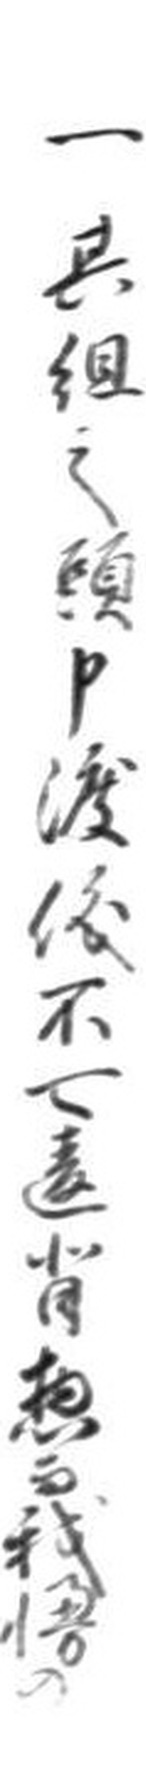一其組之頭申渡儀不可違背惣而我慢の
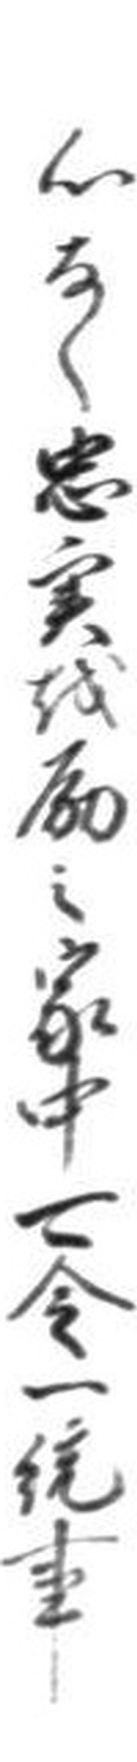心なく忠実を励み家中可令一統事
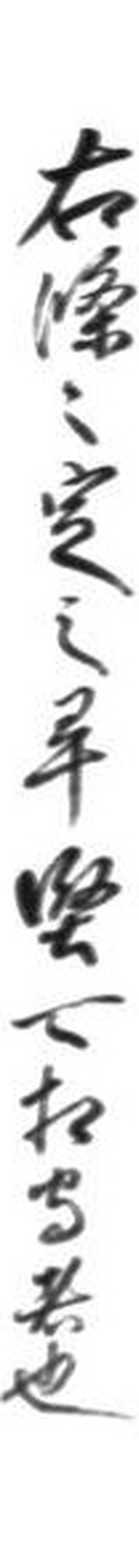右条々定之畢堅可相守者也

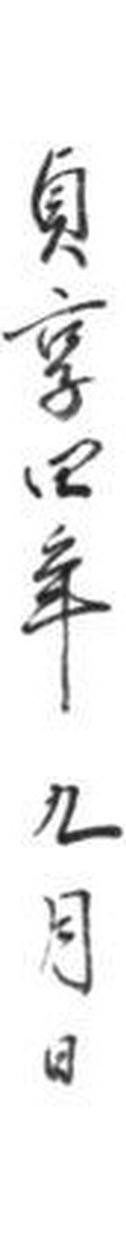貞享四年九月日
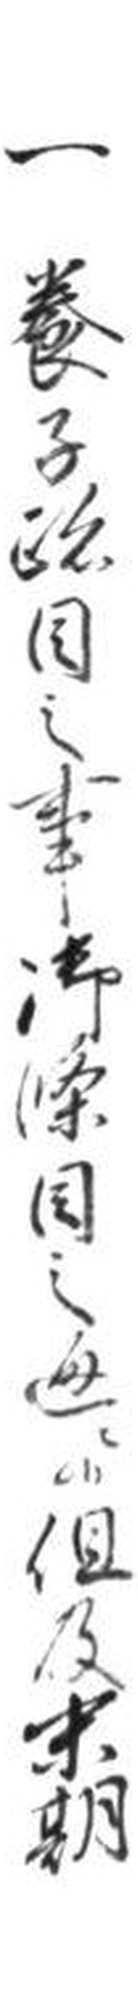一養子跡目之事御条目之通に候但及末期
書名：家譜 十六 吉品公 従貞享三年閏三月到同四年
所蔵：福井県文書館 Fukui Prefectural Archives
